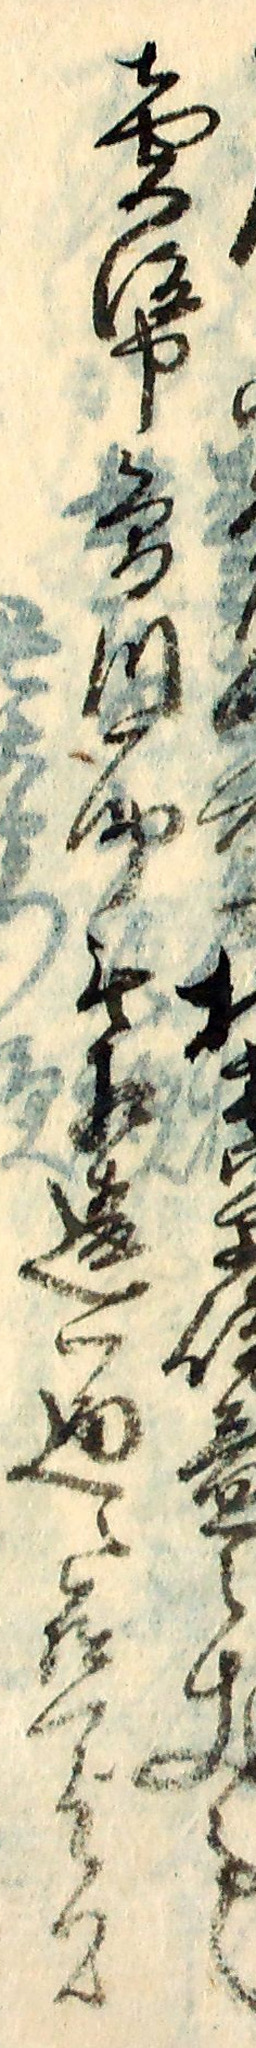売渡申候間川筋無相違御通し被遊可被下候以上
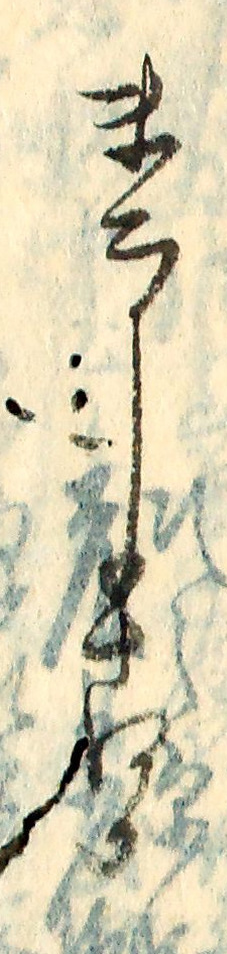未二月十四日

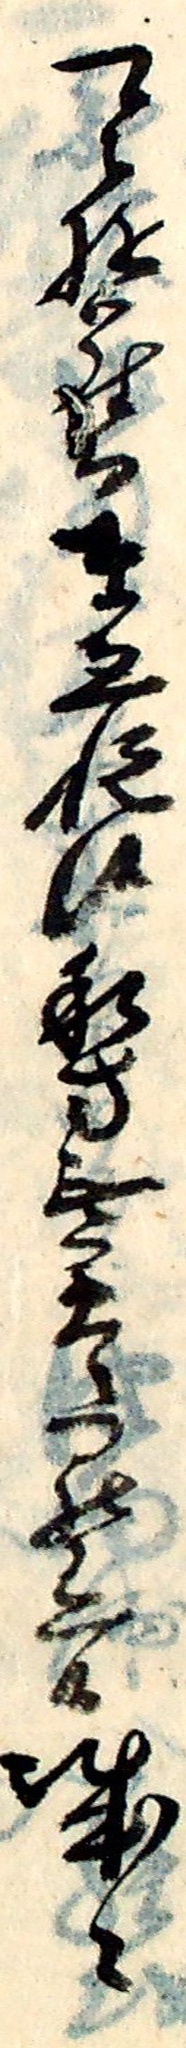可被遊御座と奉恐悦候私方無異に罷有候誠に
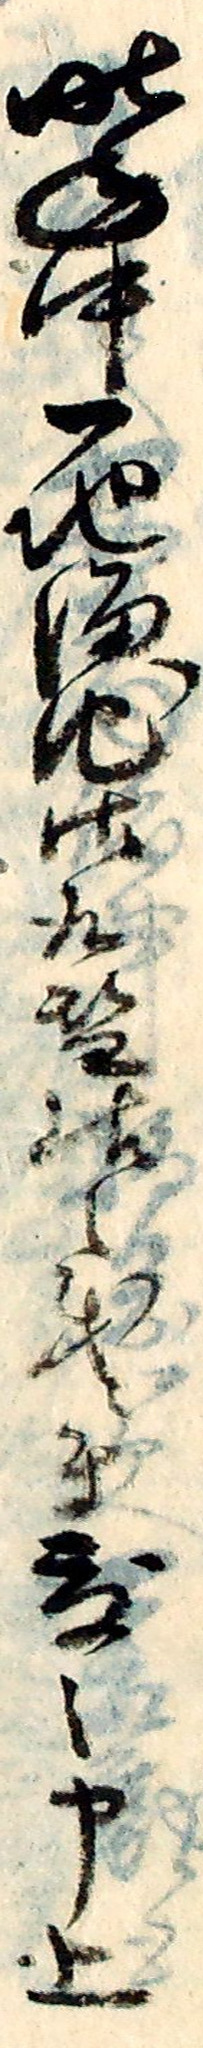昨年中一地溜池御取替銀之義に付度々申上
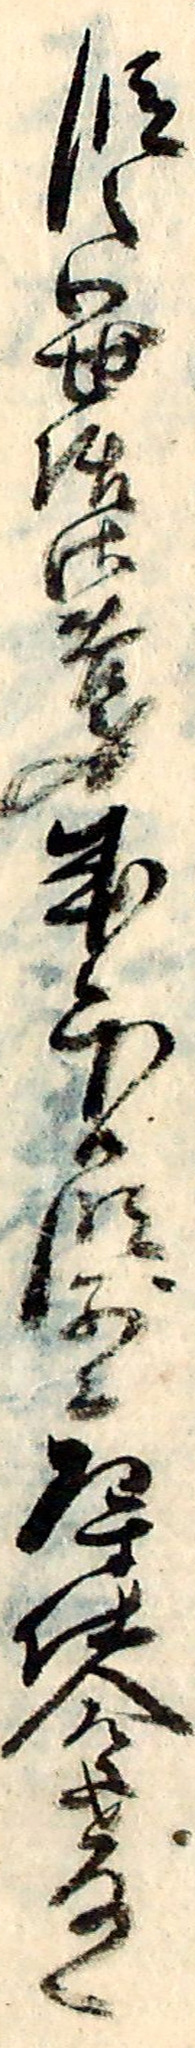段々御世話御苦身成被下候段別て辱仕合に奉存候
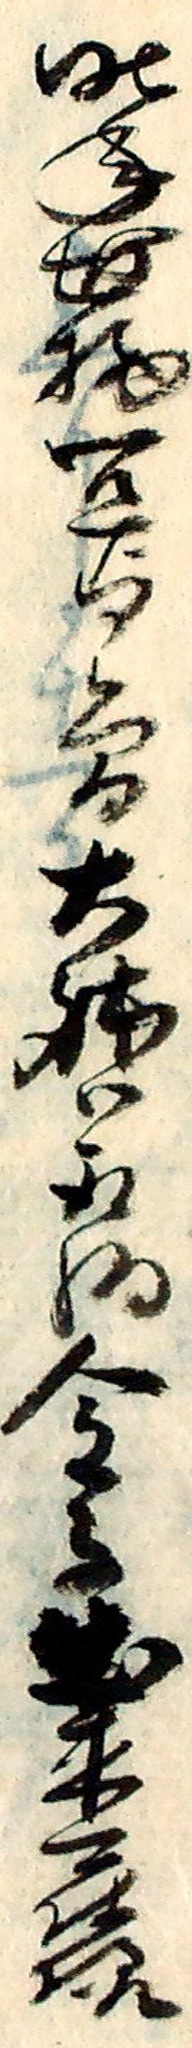昨年世柄宜布候間大躰御取得金高出来可仕様
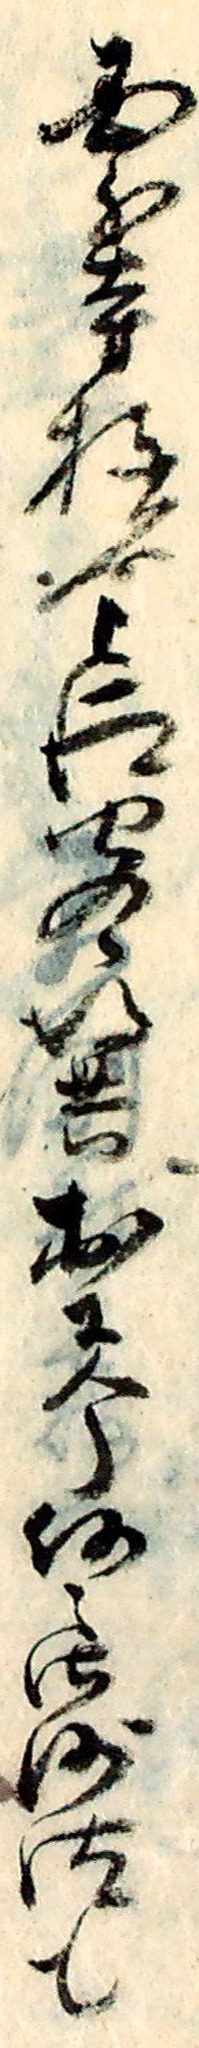国分寺様ゟ被仰聞候得共於于今何之御沙汰も
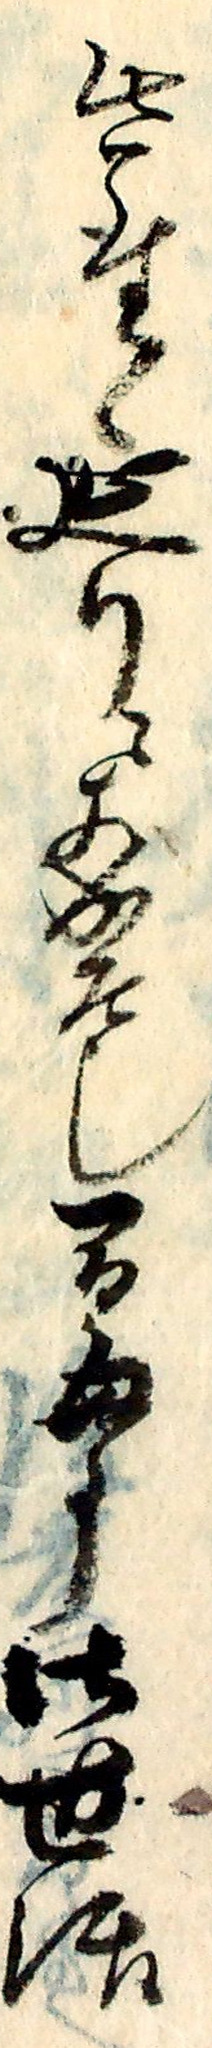無御座候延引に相成居申候間毎事御世話
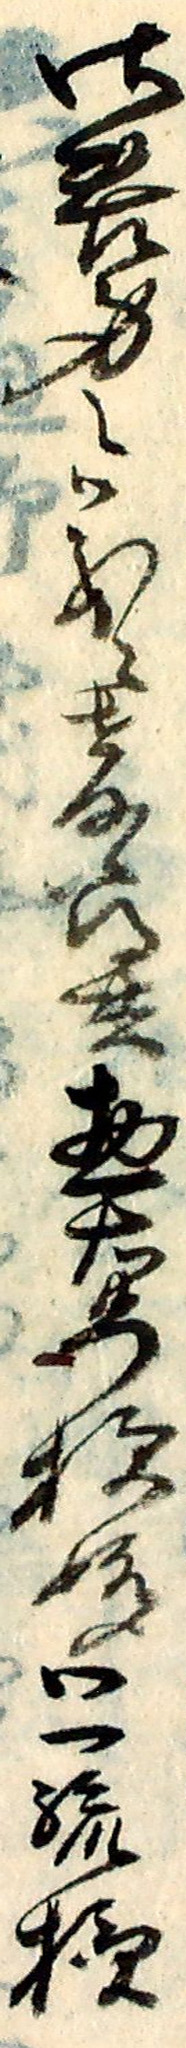御苦身之御義と奉存候得共惣右衛門様始め御一統様
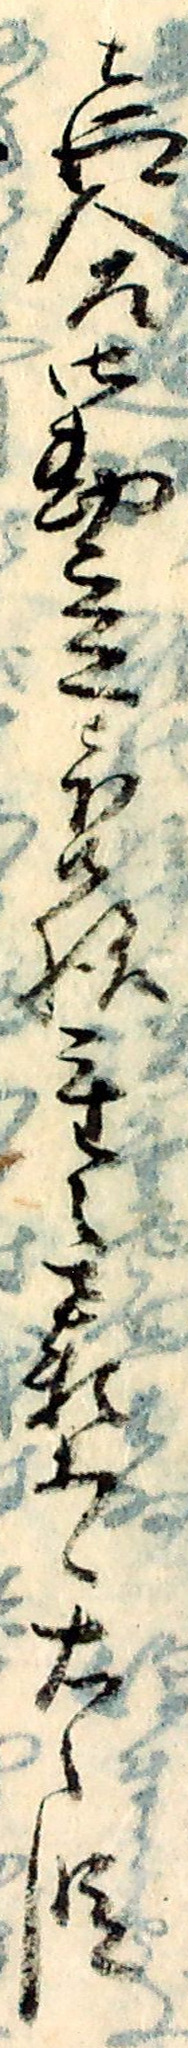被仰合御勘定被下候様重々奉頼上候右之段
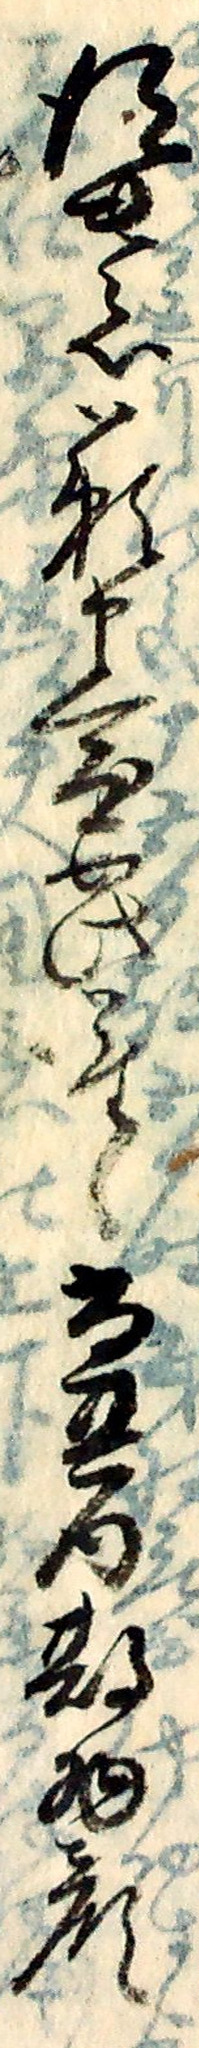得貴意御頼申上度如此御座候尚其内期拝顔
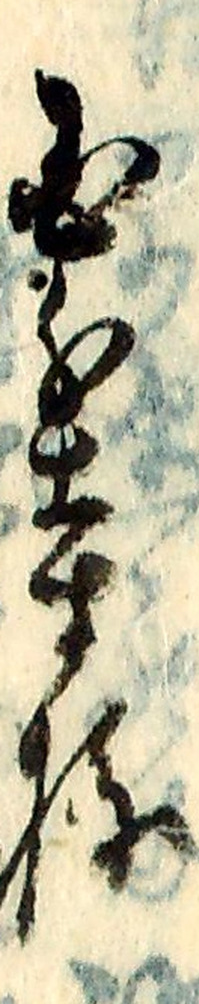国分寺様
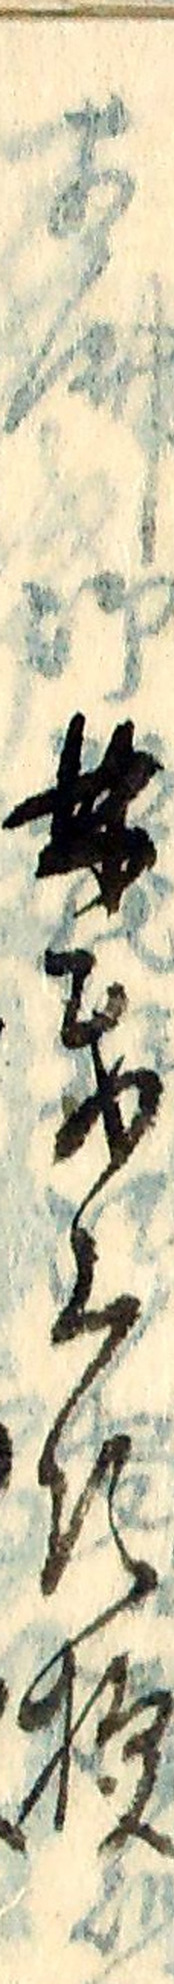林茂三次様
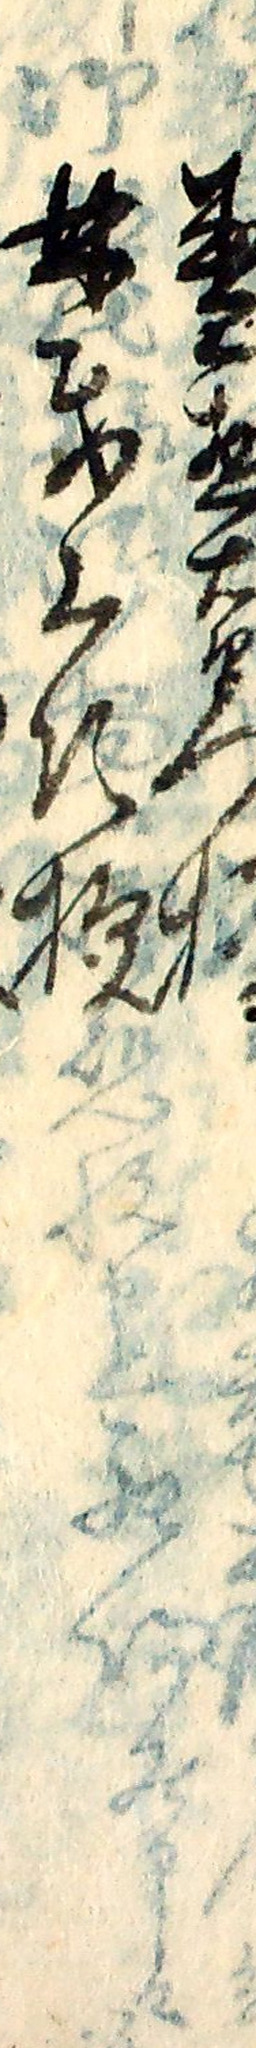林茂三次様
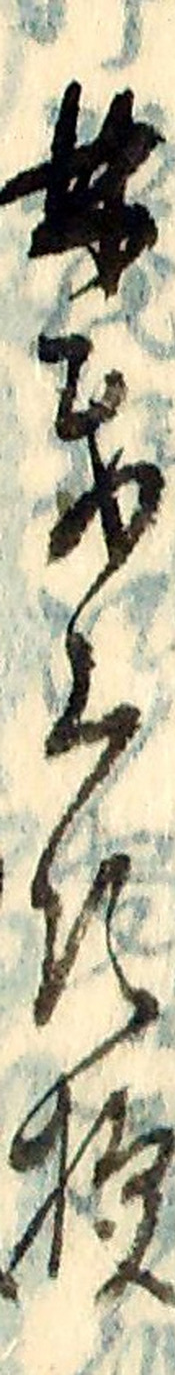林茂三次様
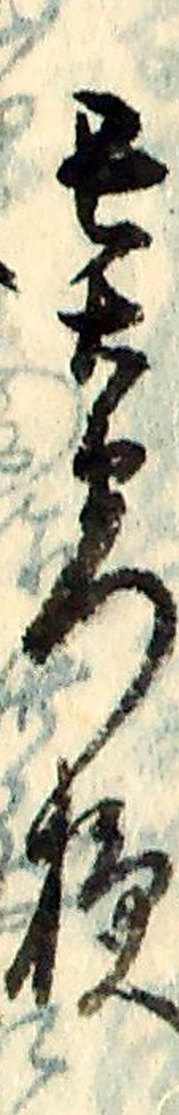長右衛門様
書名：諸御願書控(後藤氏壱番）
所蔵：鳴門教育大学 Naruto University of Education
